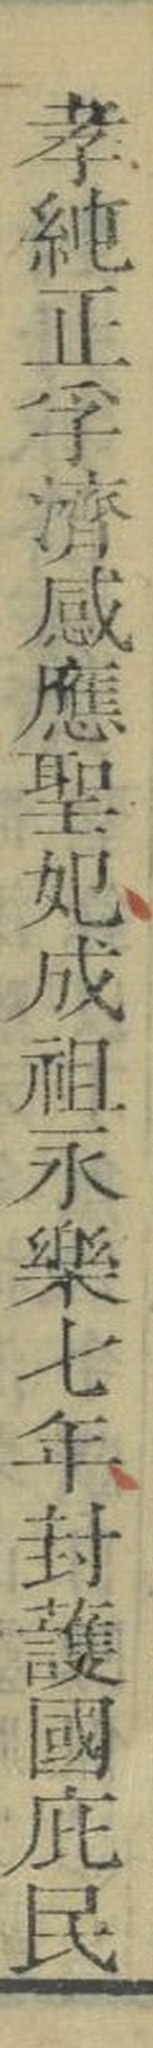孝純正孚濟感應聖妃成祖永樂七年封䕶國庇民
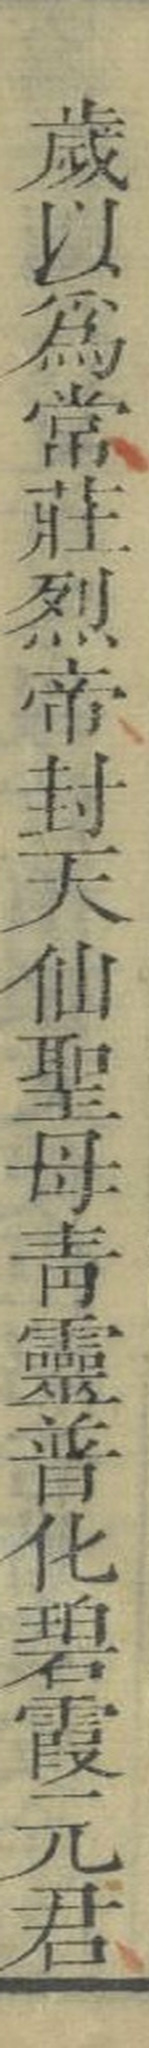歲以爲常莊烈帝封天仙聖母靑靈普化碧霞元君
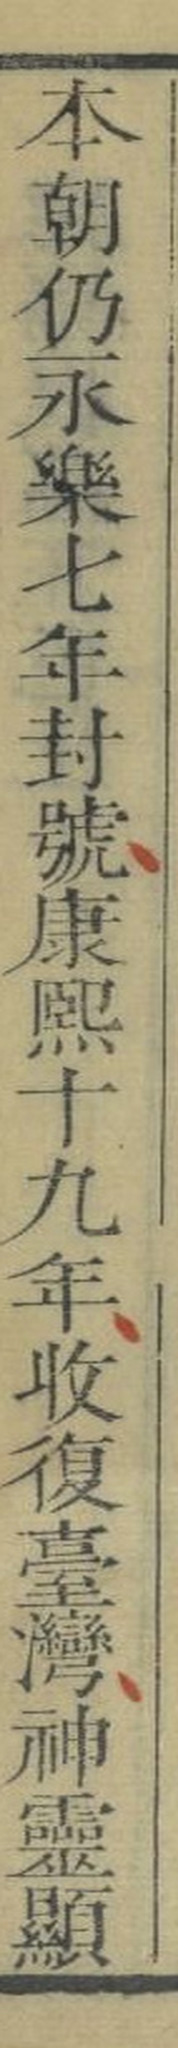本朝仍永樂七年封號康熙十九年收復臺灣神靈顯

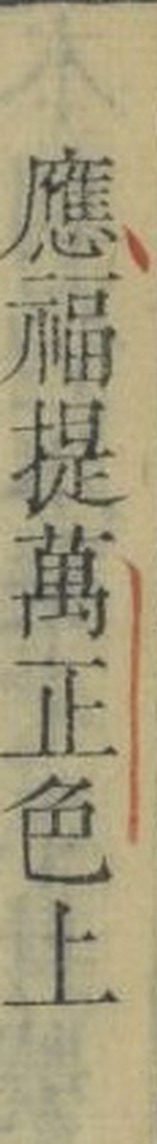應福提萬正色上
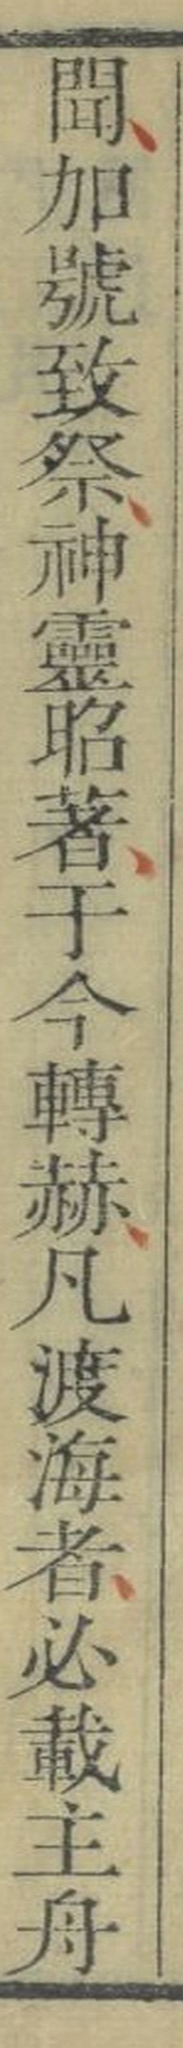聞加號致祭神靈昭著于今轉赫凡渡海者必載主舟
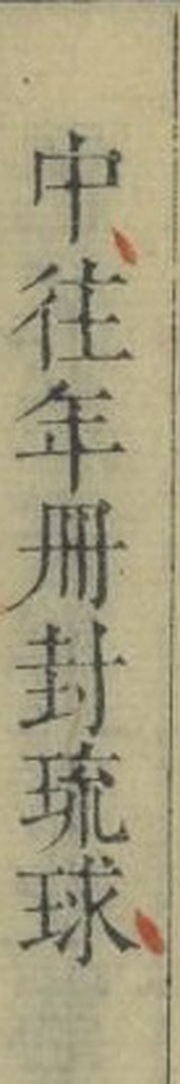中往年冊封琉球
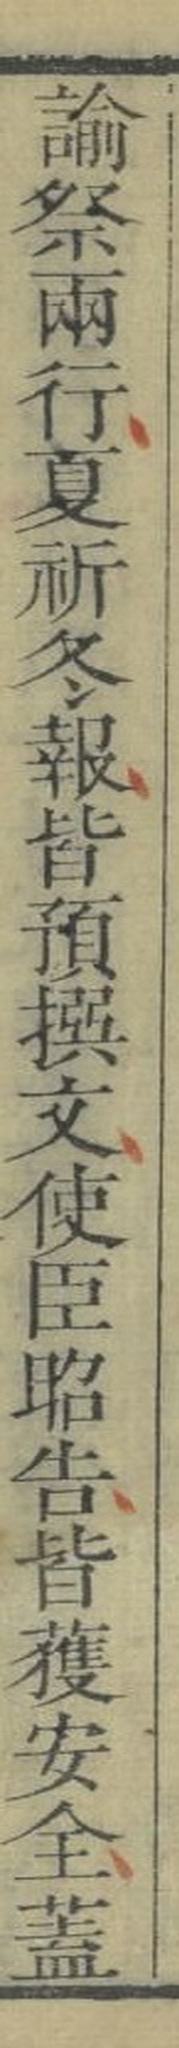諭祭兩行夏祈冬報皆預撰文使臣昭告皆獲安全蓋
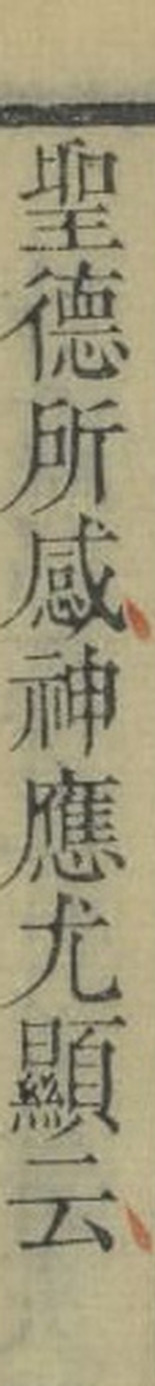聖德所感神應尤顯云
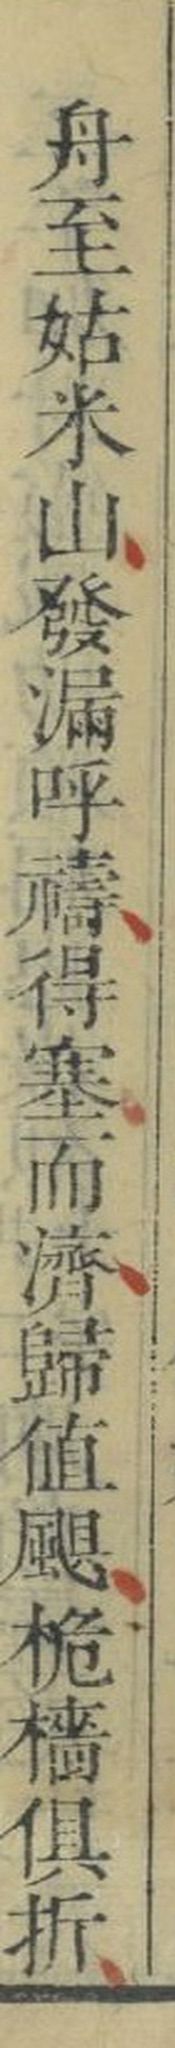舟至姑米山發漏呼禱得塞而濟歸値颶桅檣俱折
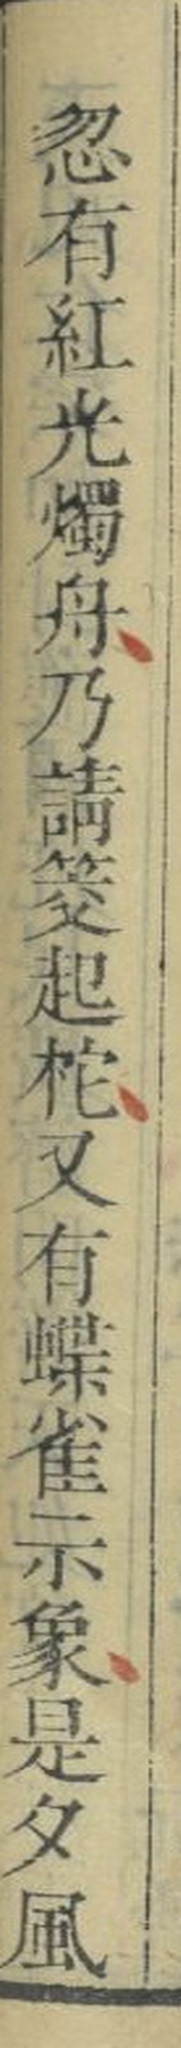忽有紅光燭舟乃請筊起柁又有蝶雀示象是夕風
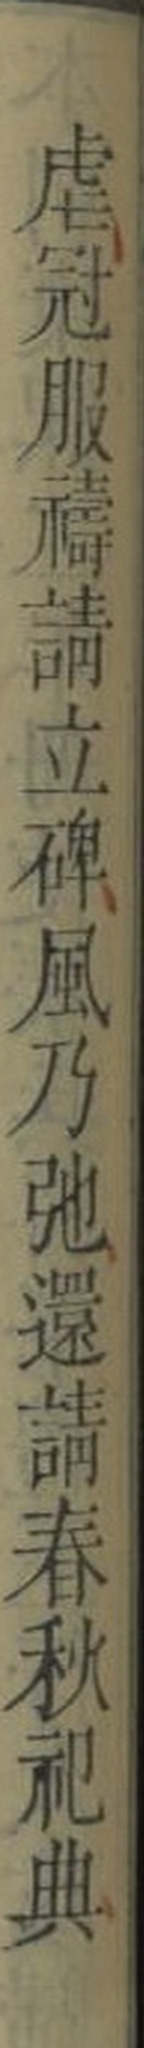虐冠服禱請立碑風乃弛還請春秋祀典
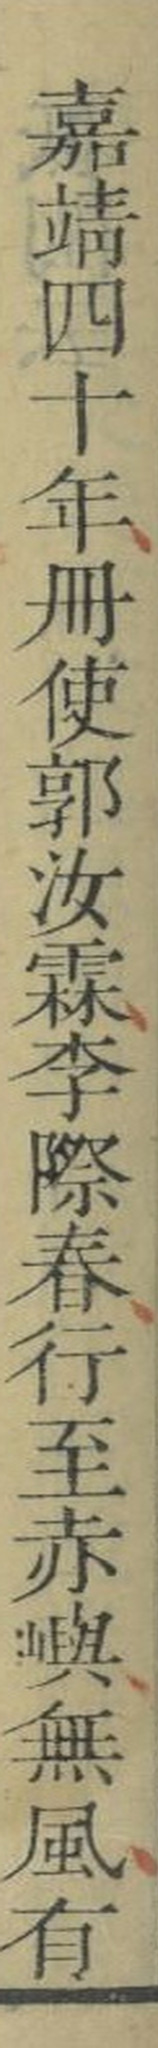嘉靖四十年冊使郭汝霖李際春行至赤嶼無風有
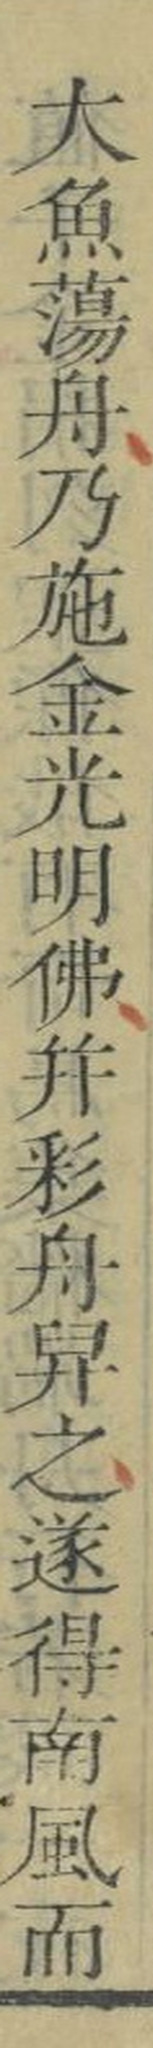大魚蕩舟乃施金光明佛并彩舟舁之遂得南風而
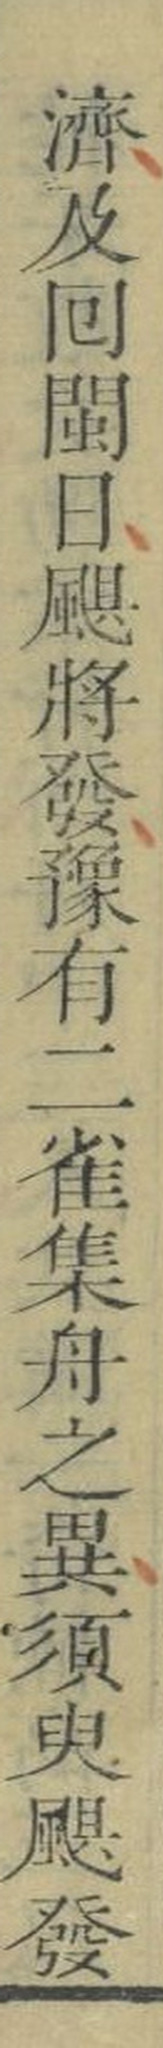濟及囘閩日颶將發豫有二雀集舟之異須臾颶發
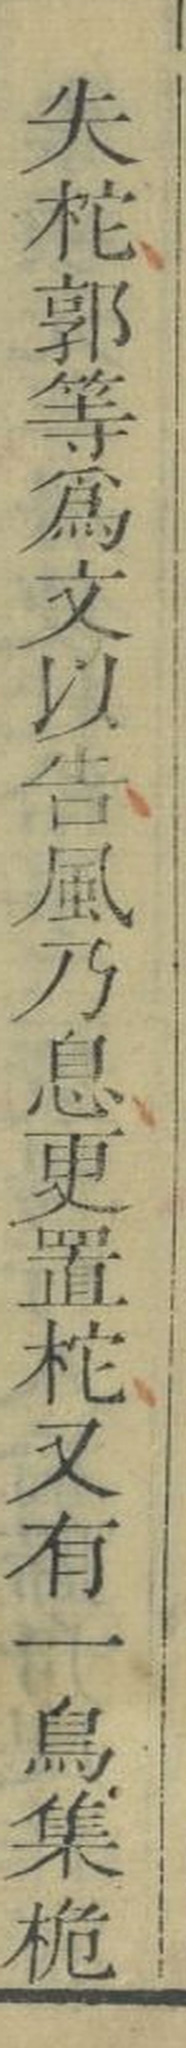失柁郭等爲文以告風乃息更置柁又有一鳥集桅
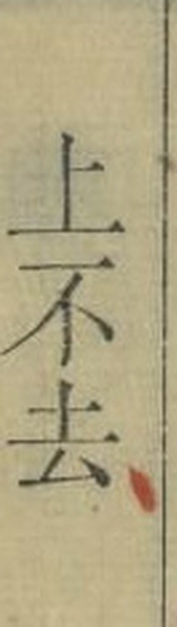上不去
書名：中山伝信録 巻一、巻二
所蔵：University of the Ryukyus Library
